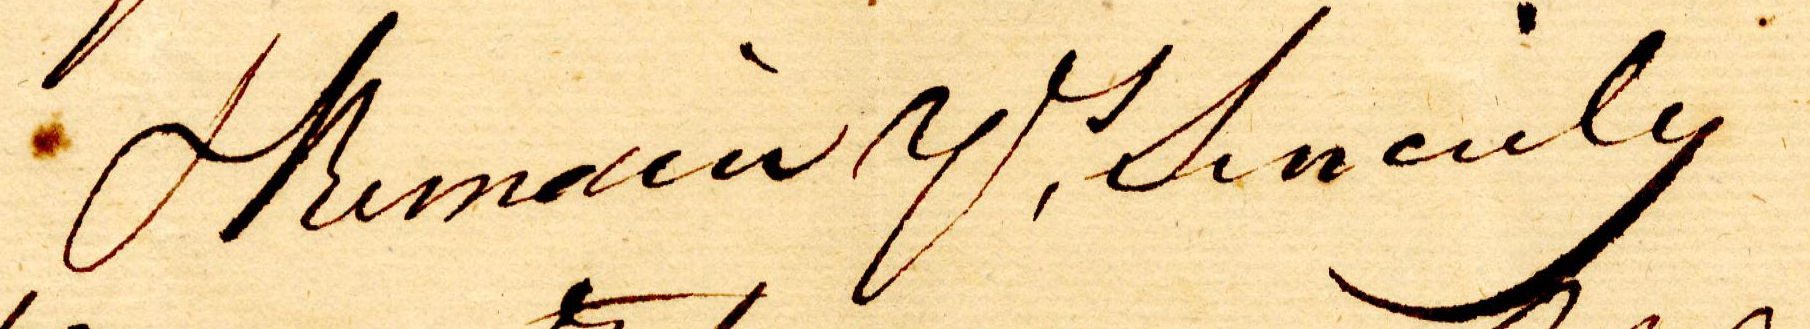& Remain y^s Sincerely
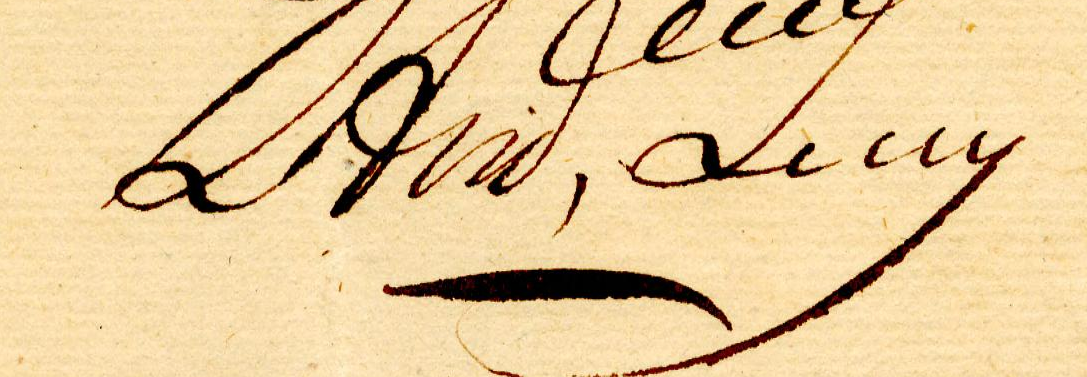And^rew Levy
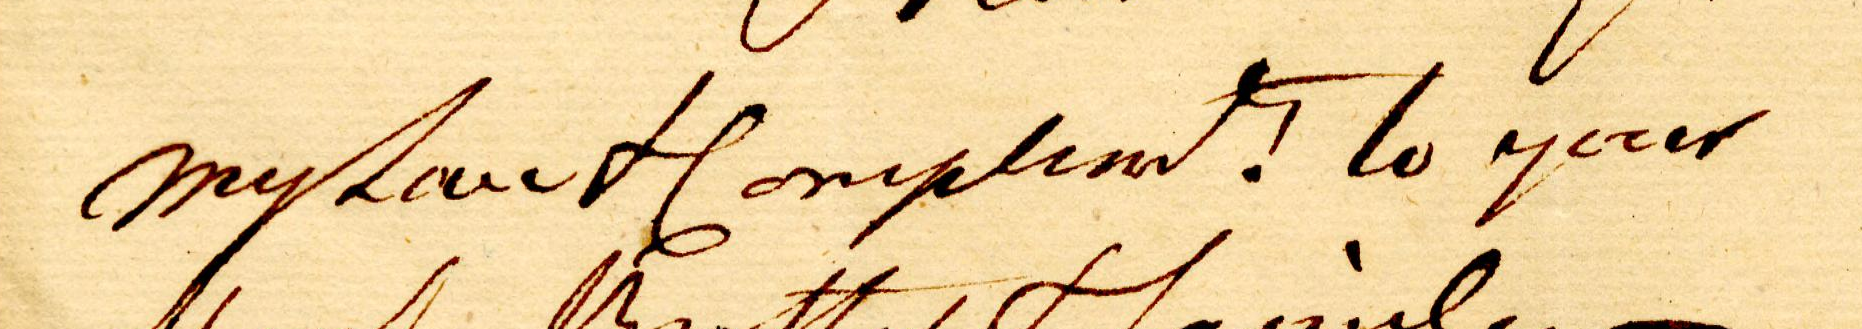my Love & Complemn^ts. to your
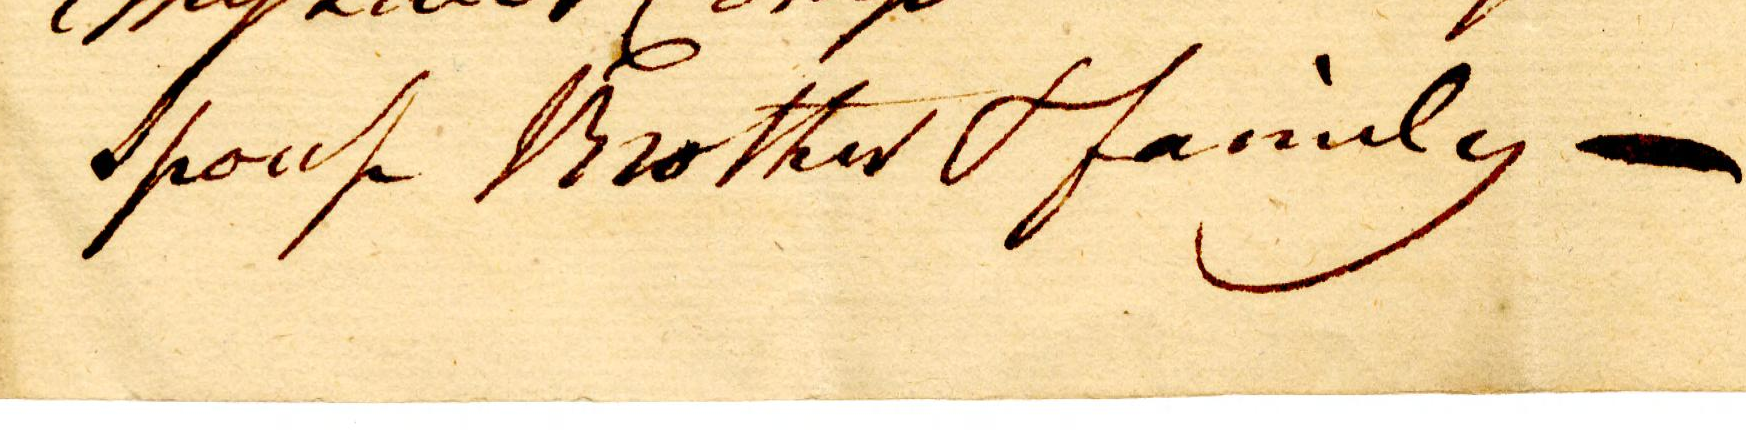spouse Brother & family.-
